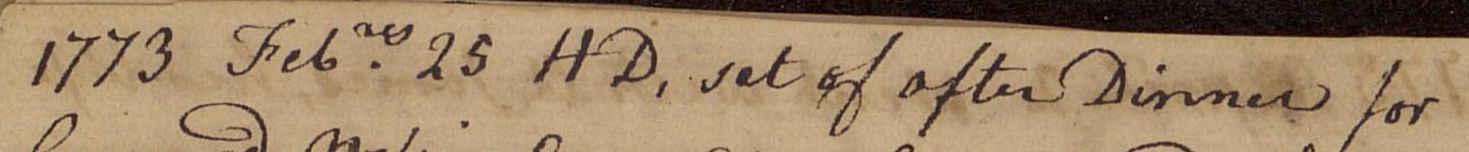1773 Feb^ry. 25 HD, set of after Dinner for
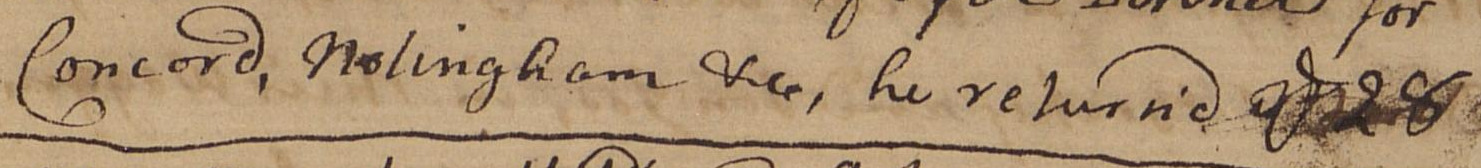Concord, Notingham &c, he return'd [y^e 28]
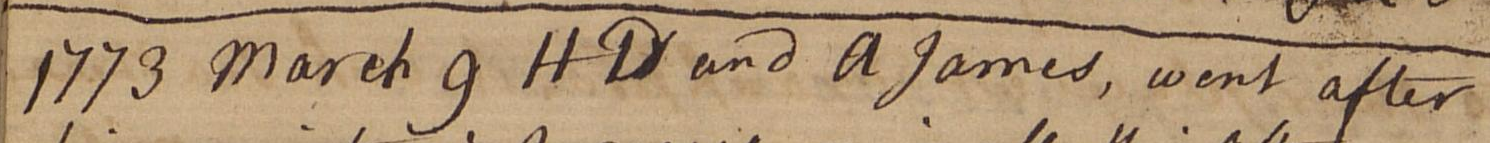1773 March 9 HD and A James, went after
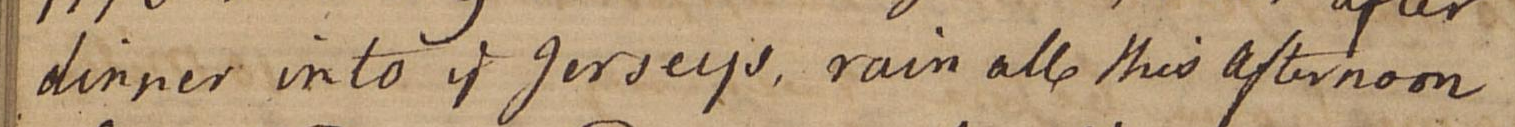dinner into y^e Jerseys, rain all this Afternoon
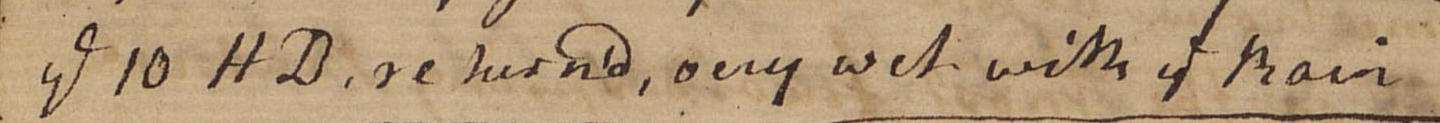y^e 10 HD. return'd, very wet with y^e Rain
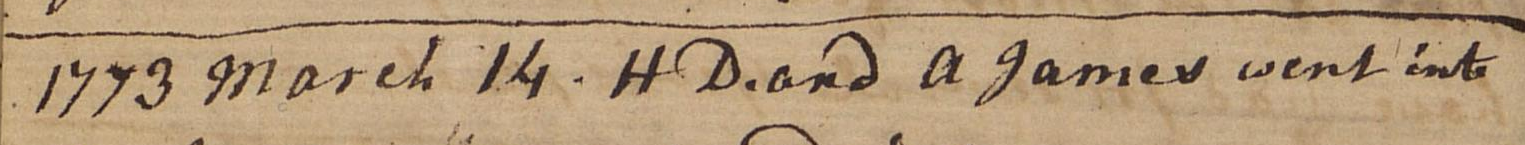1773 March 14. HD. and A James went into
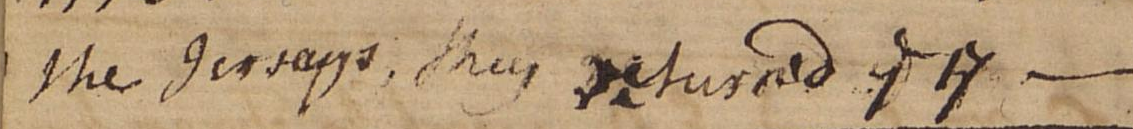the Jersays, they return'd y^e 17-
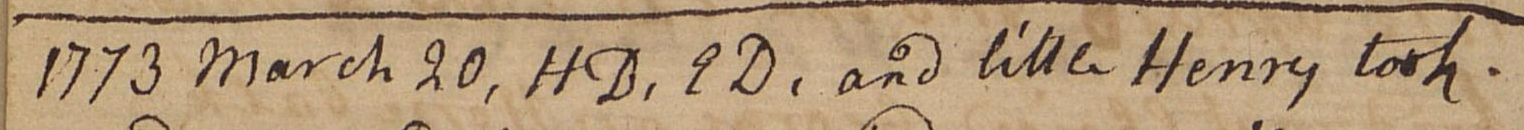1773 March 20, HD, ED, and little Henry took.
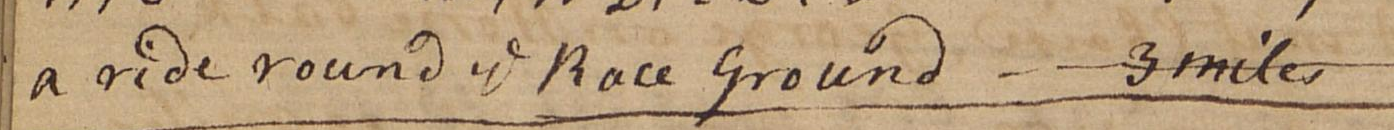a ride round y Race Ground- 3 miles
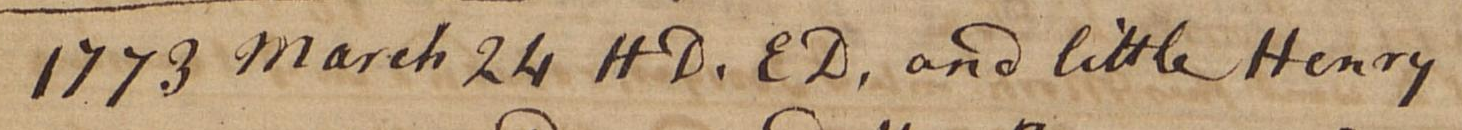1773 March 24 HD. ED, and little Henry
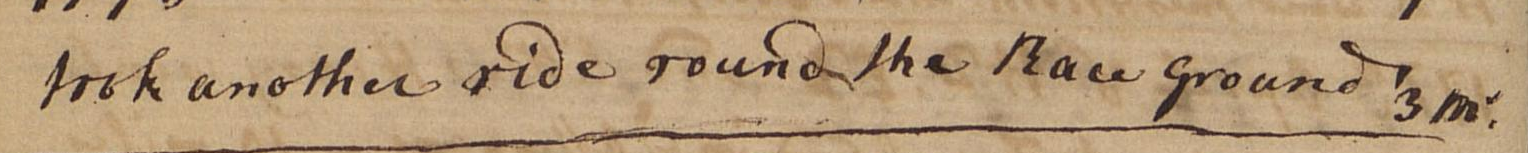took another ride round the Race Ground 3m:
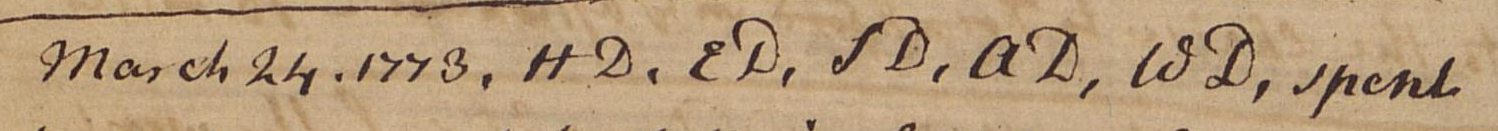March 24. 1773, HD. ED. SD. AD, WD, spent
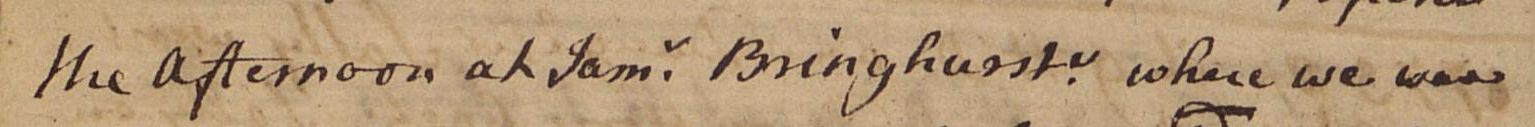the Afternoon at Jam^s. Bringhurst^s. where we was
